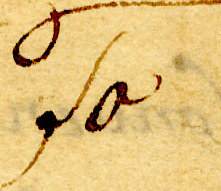To
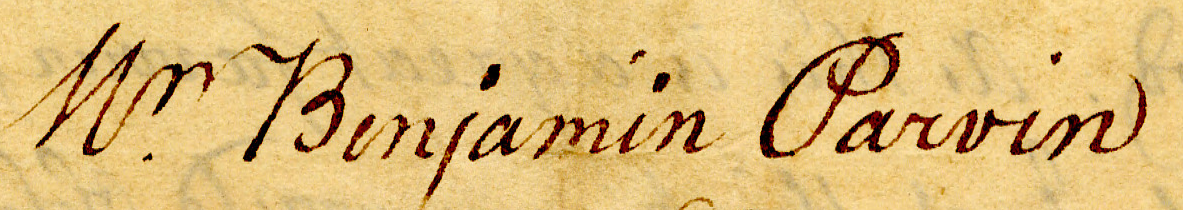M^r. Benjamin Parvin
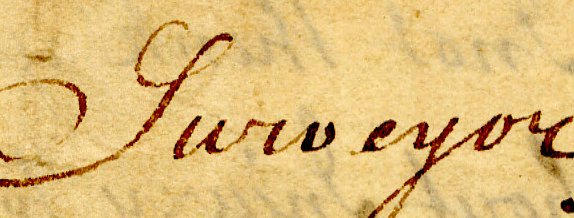Surveyor
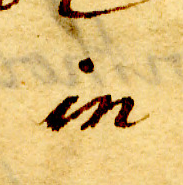in
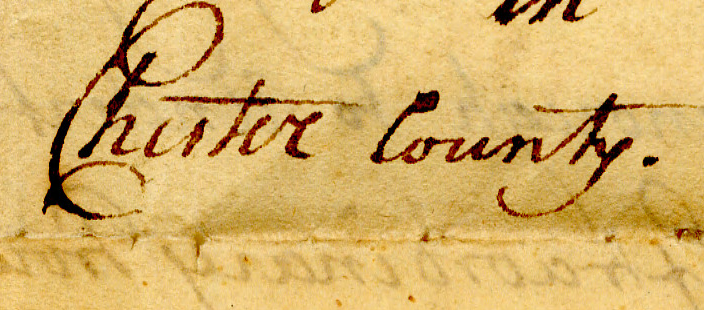Chester County.
